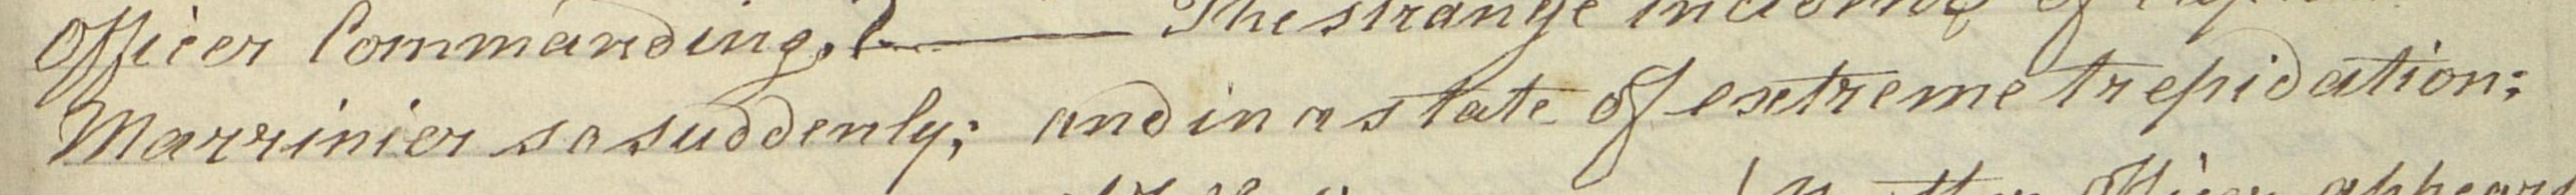Marrinier so suddenly; and in a state of extreme trepidation;
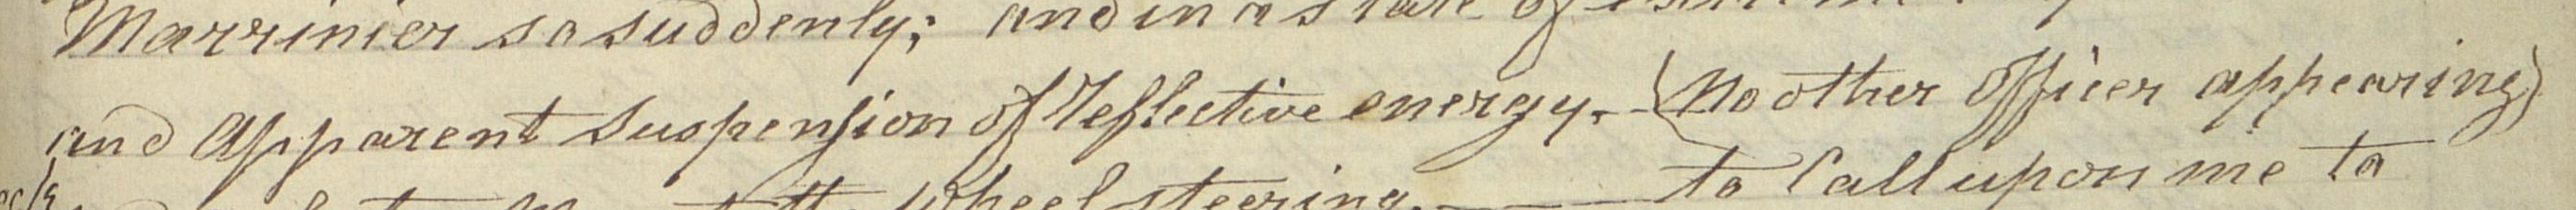and apparent suspension of reflective energy, (No other officer appearing)
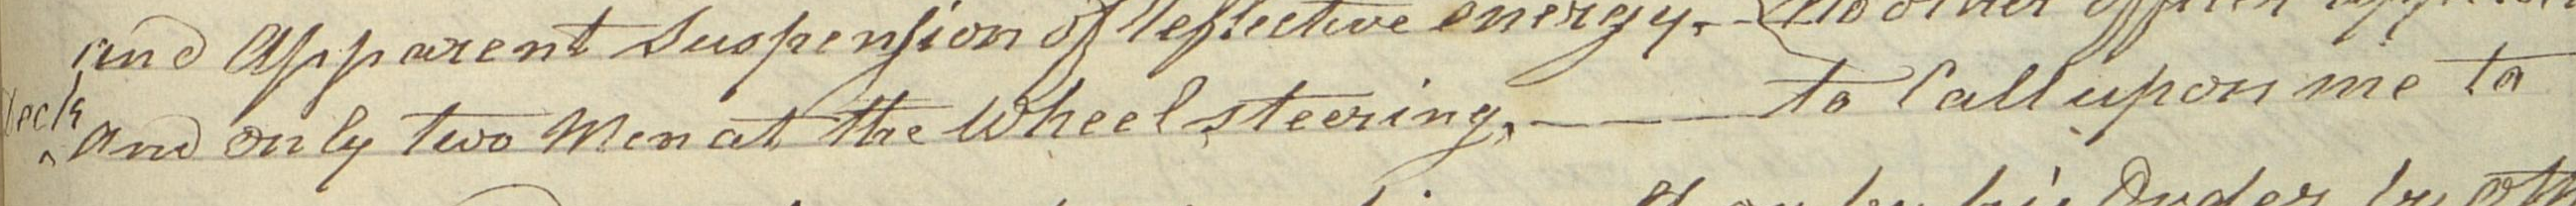^Deck and only two men at the wheel steering, to call upon me to
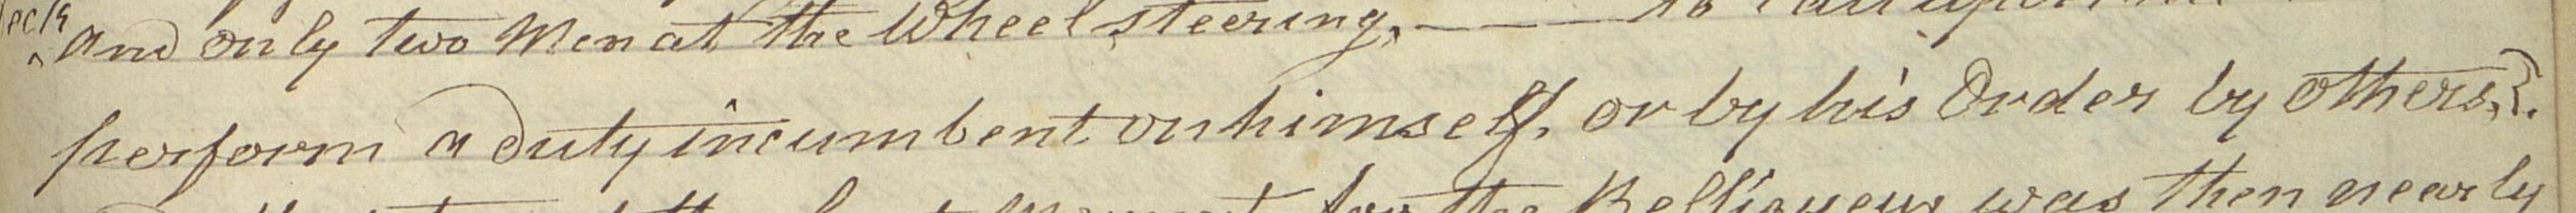perform a duty incumbent on himself, or by his Order by others?
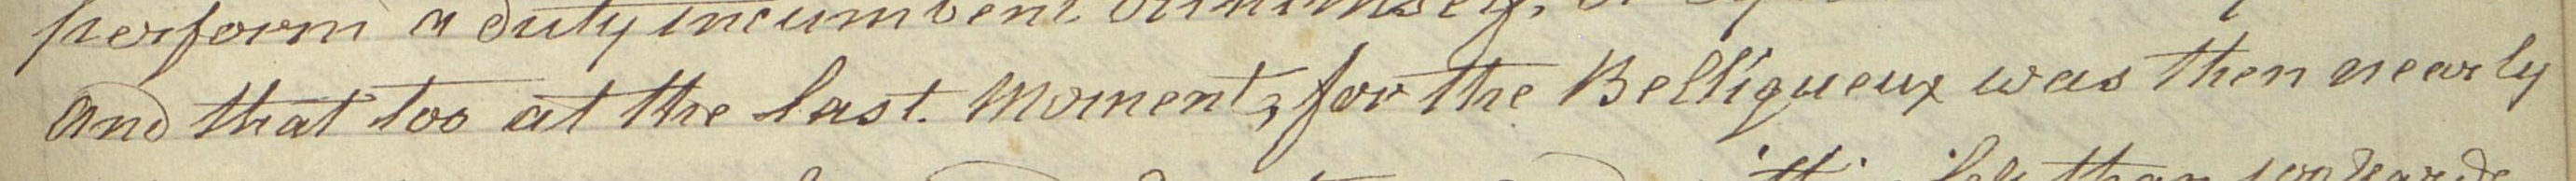And that too at the last moment, for the Belliqueux was then nearly
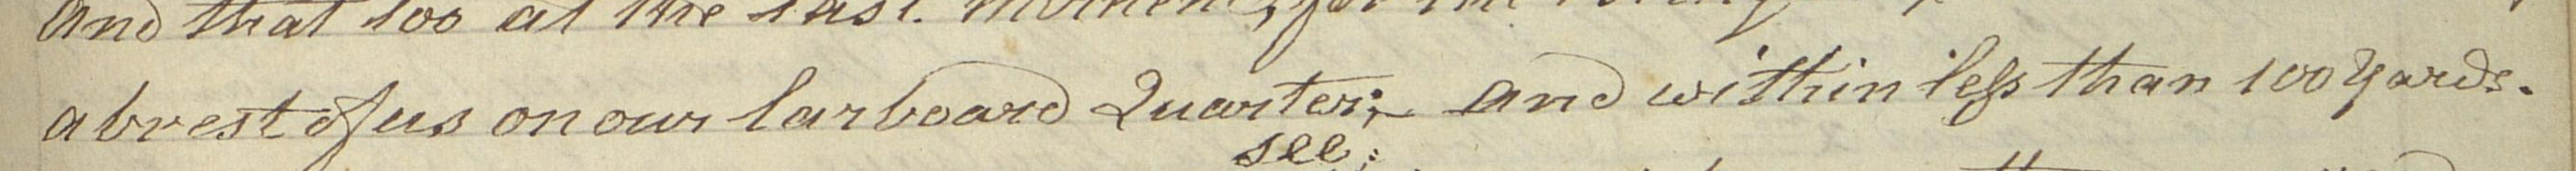abrest of us on our Carboard Quarter; and within less than 100 Yeards.
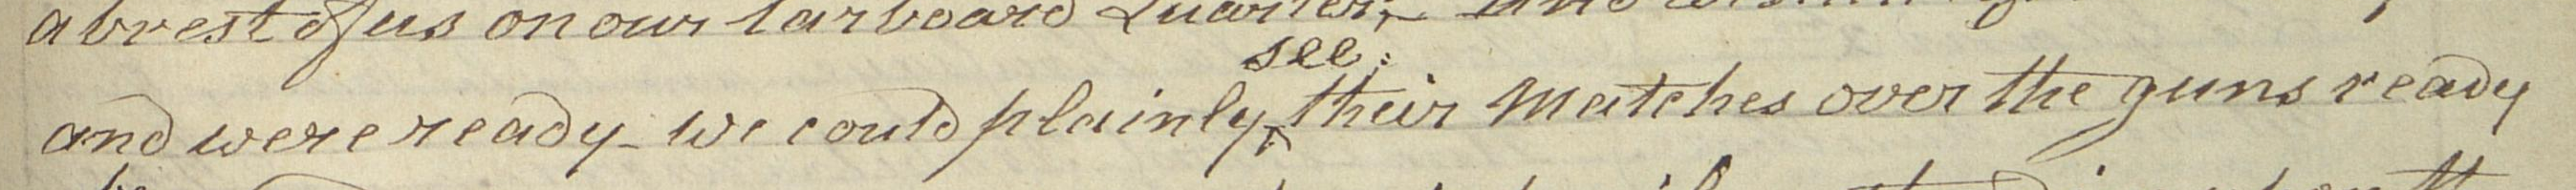and were ready we could plainly ^ their matches over the guns ready
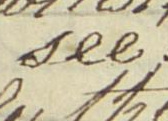see
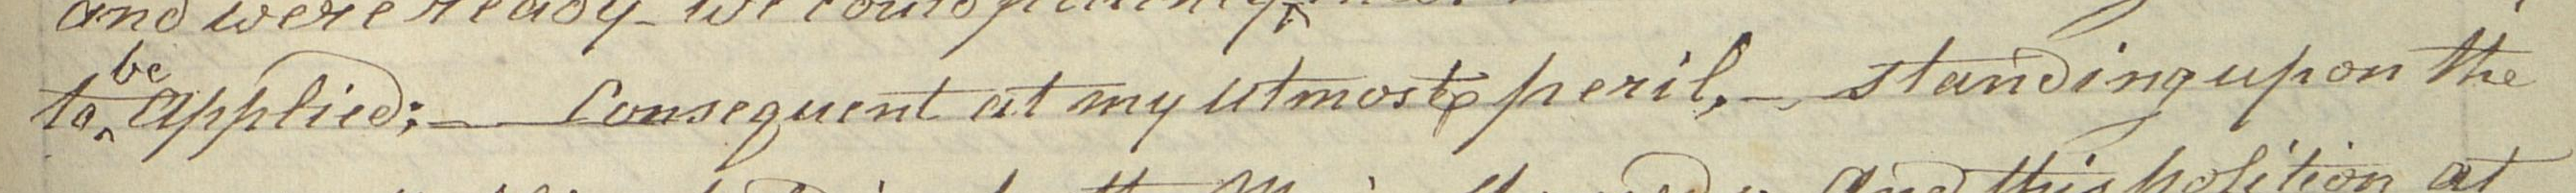to ^ applied; Consequent at my utmost peril, standing upon the
